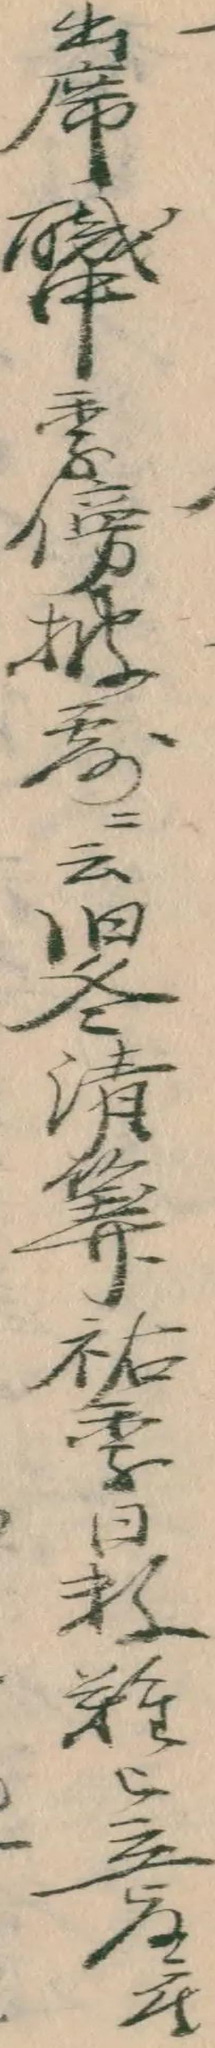出席職中季傍披露ニ云旧冬清算祐季日数難被立旨ニ付
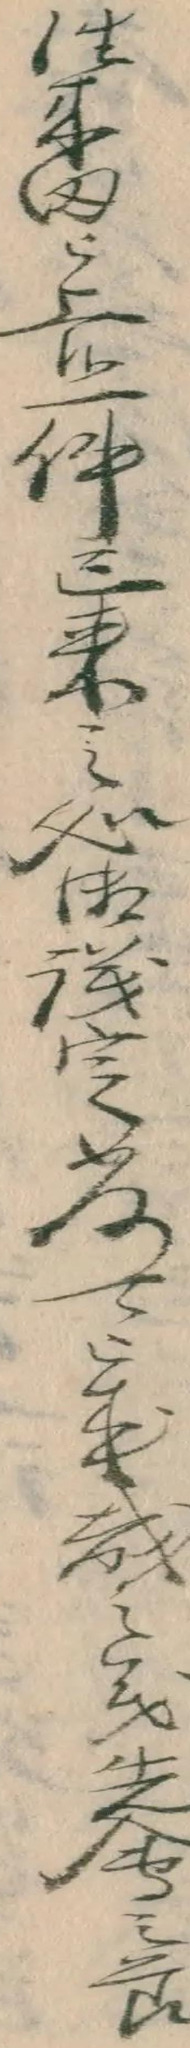往来由被上候一件已来之処御議定如何可被成哉之義先會之節
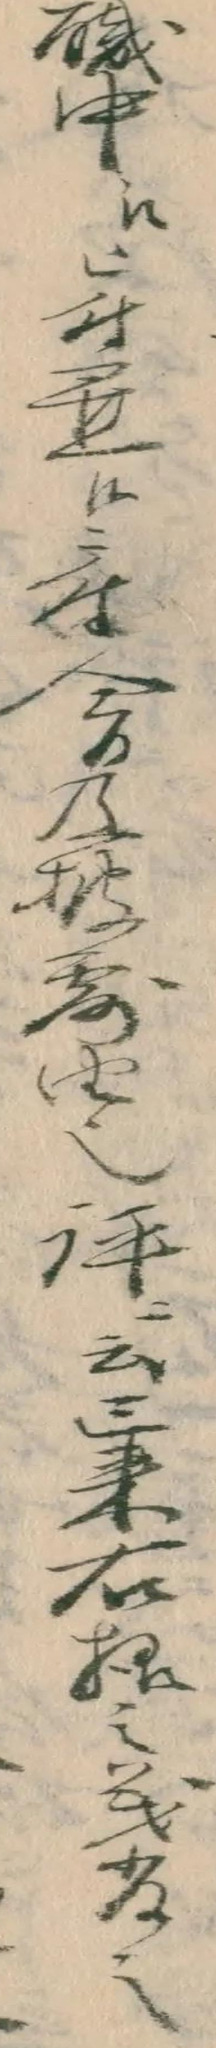職中え被付置候ニ付今日及披露由也評ニ云已来右様之義有之
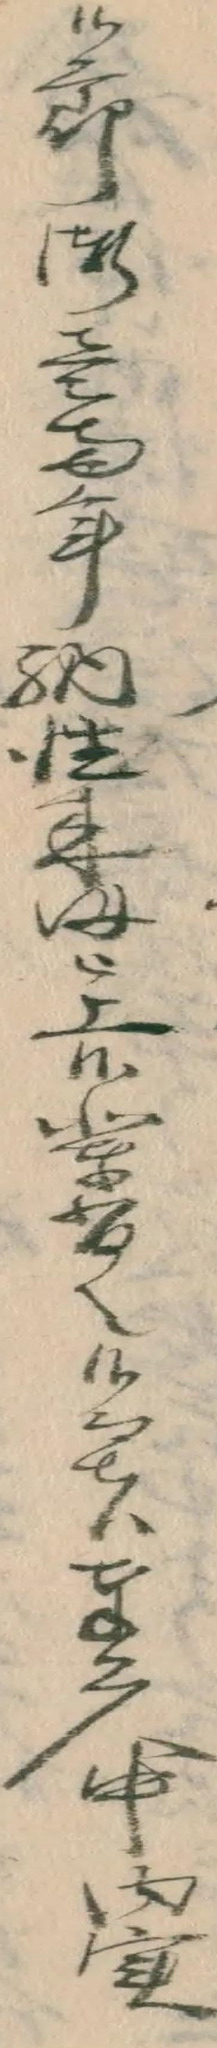候節漸壱両年納往来再被上候輩有之候而は奉公人中内実
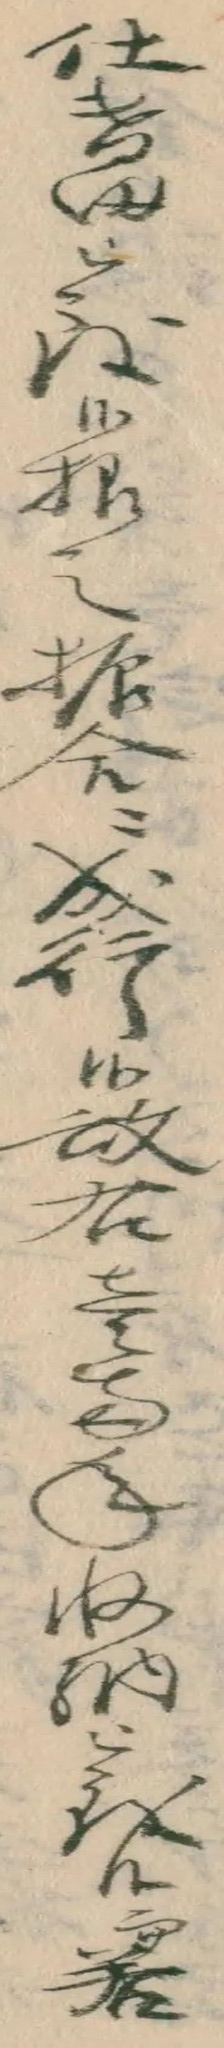仕替田被致候様之振合ニ成行候故右壱両年収納被致候而着
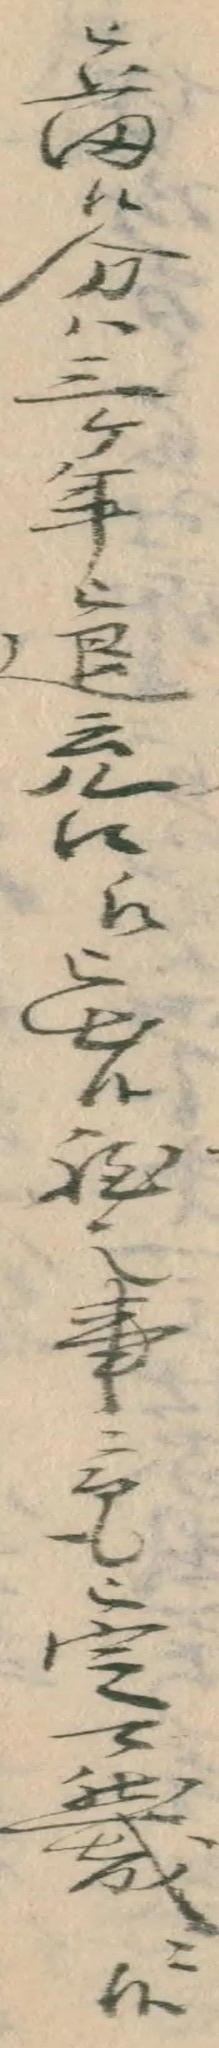被上田候分ハ三ケ年被退充に候被出候程之事ニ而も被定可然哉ニ候
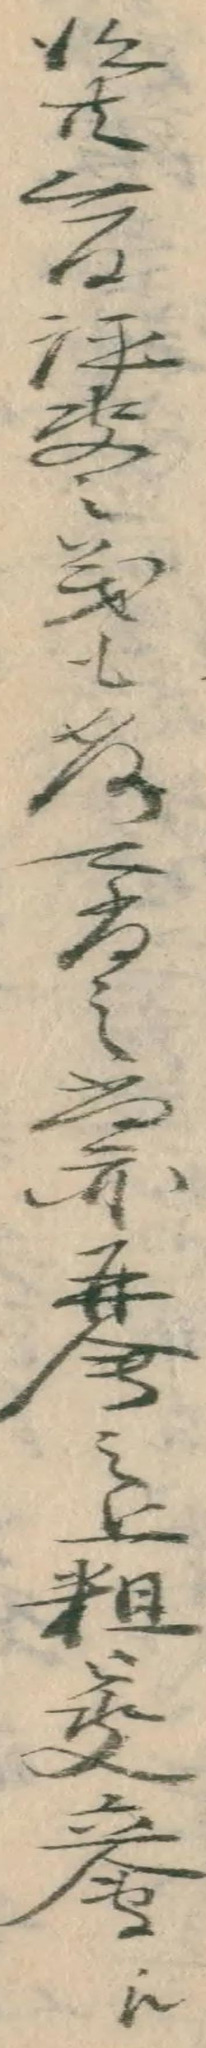得共今日評決之義も如何可有之尚亦再會之上粗被決立會候
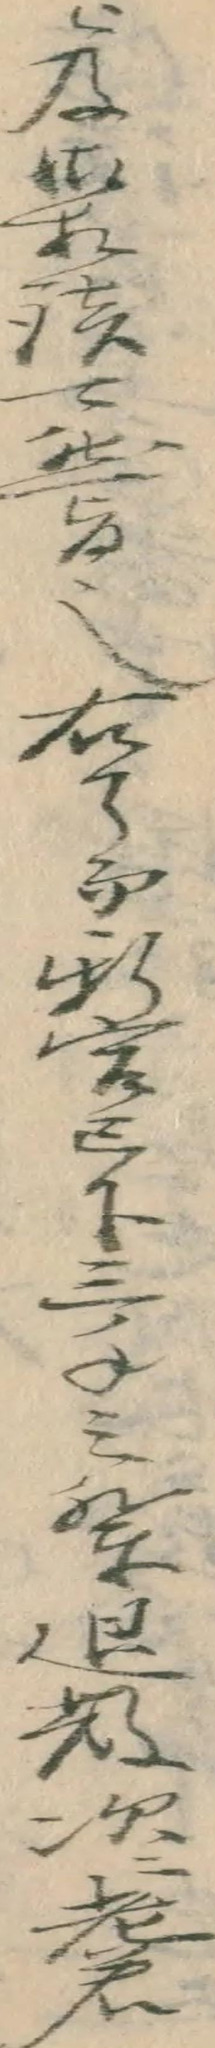被及御相談可然旨也右了而新宮已下三手之輩退散次ニ老若
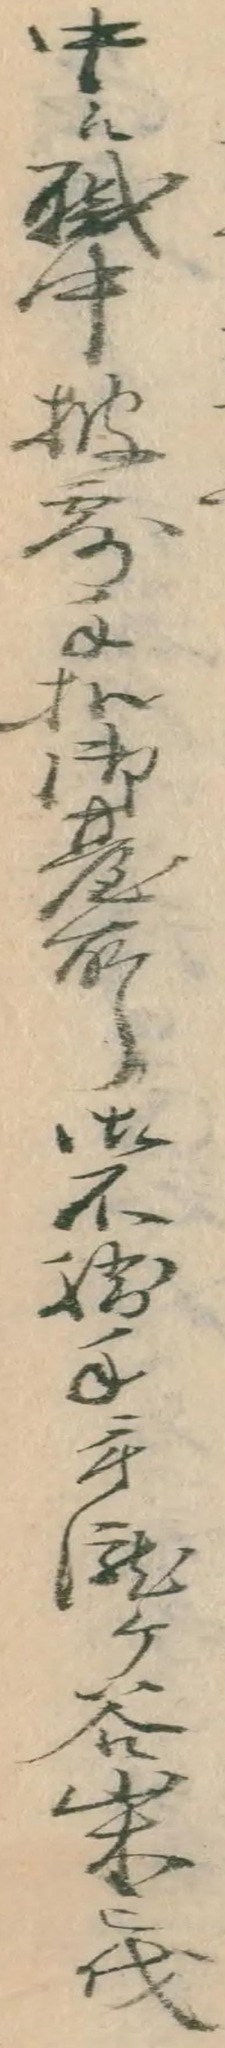中え職中披露手扣御䑓所御不勝手ニ付瀧ヶ谷山木被伐

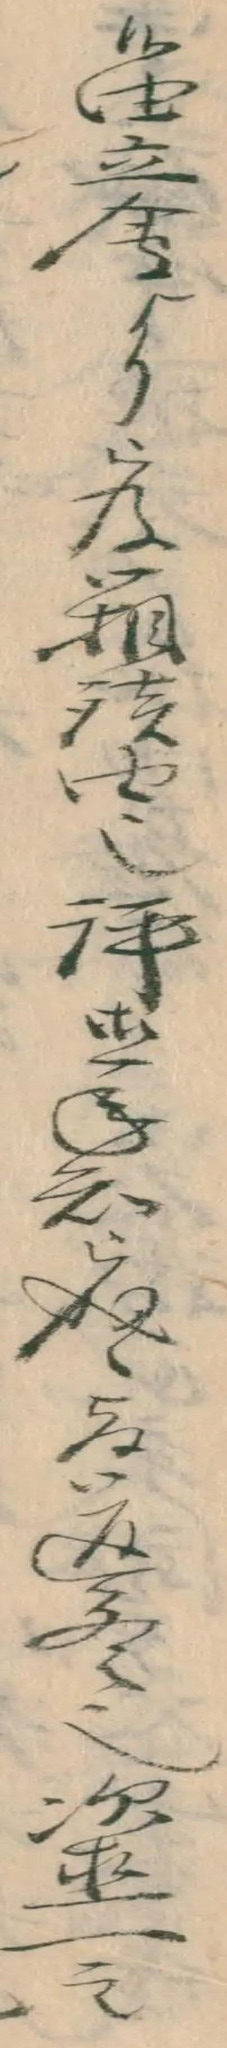候由立會より被及箱談由也評御承知被成候旨御返答也次直一之
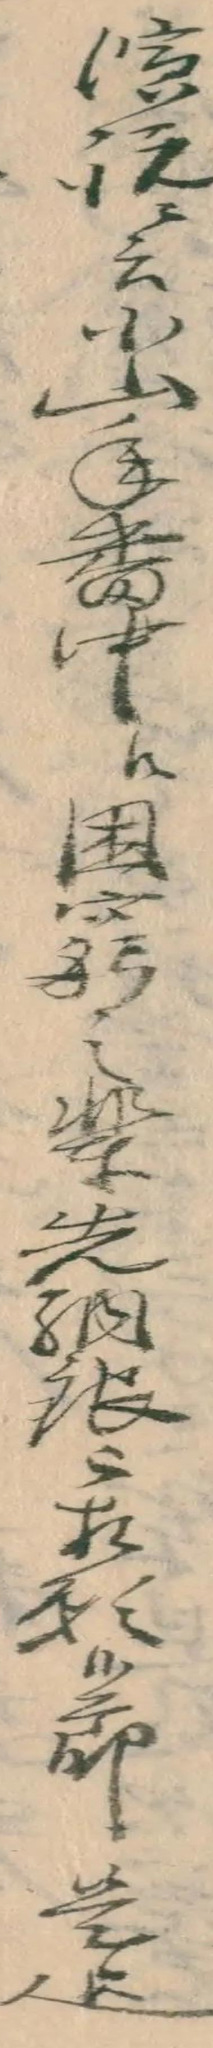演説ニ云小山年番中え困窮之輩先納銀被相願候節是迄
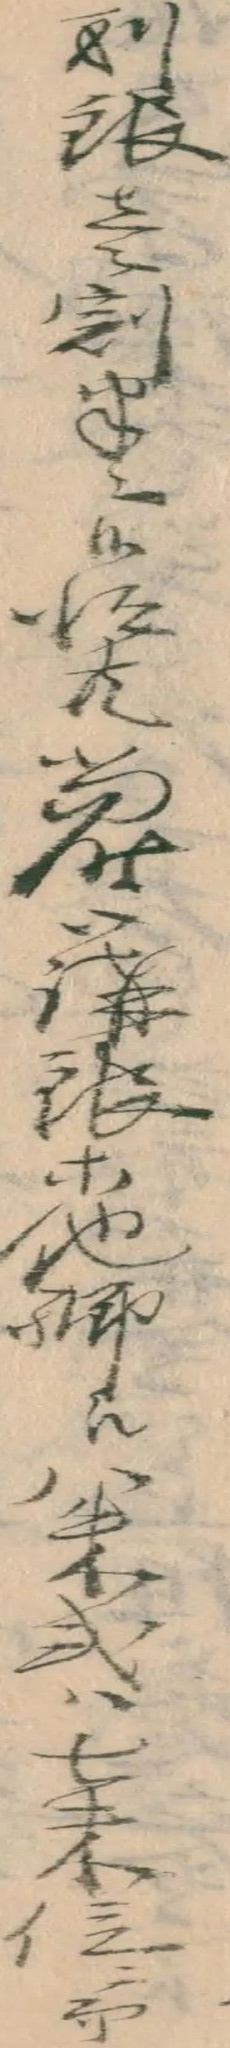利銀壱割半ニ候得共當時御講銀等他郷え八朱或ハ七朱位ニ而
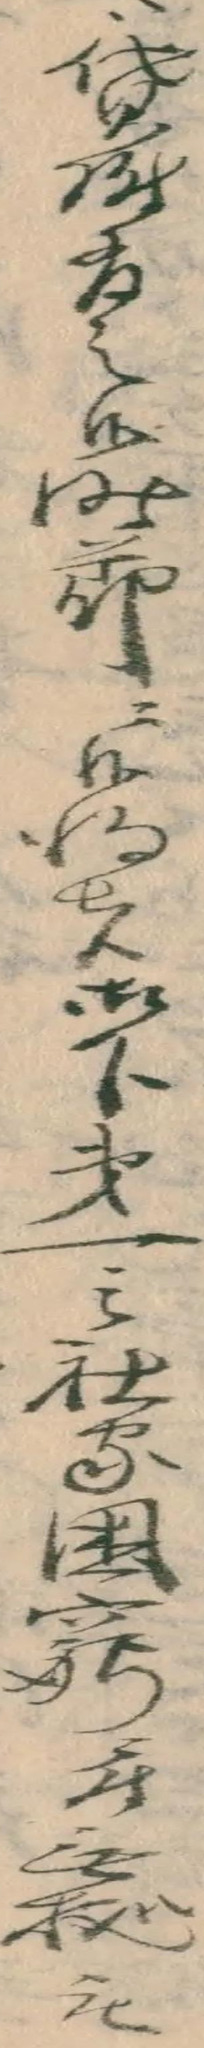ハ貸附有之候時節に候得は御下弟一之社家困窮ニ付無拠被
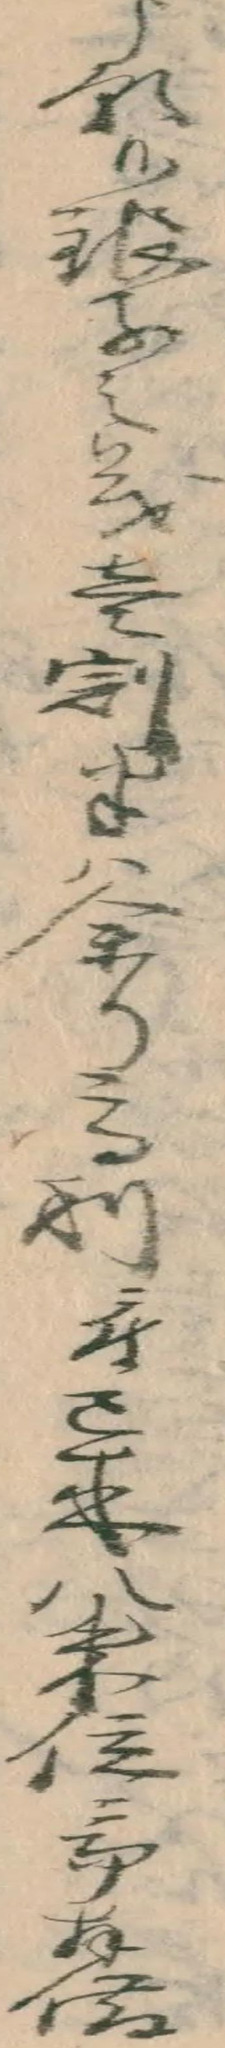申領候銀子之義壱割半ハ余り高利ニ付巳来八朱位ニ而拝借
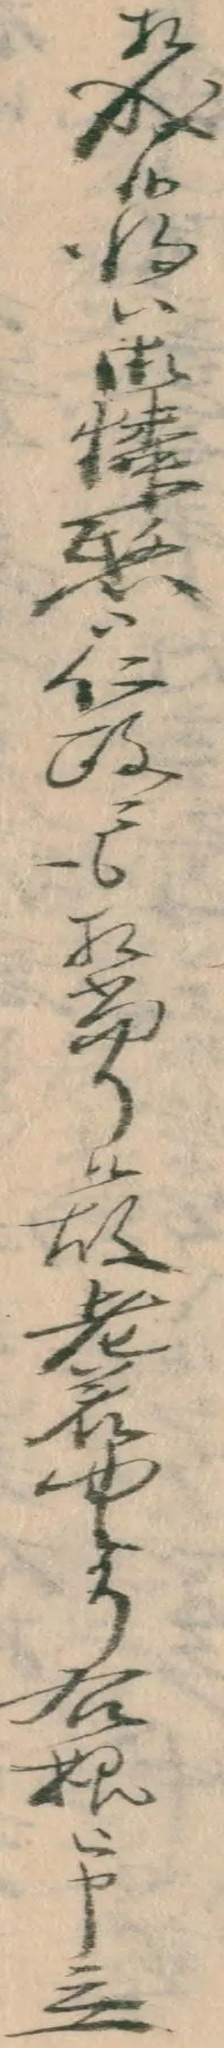相成候得ハ御憐愍御仁政ニも相當り候故老若中より右様被申立
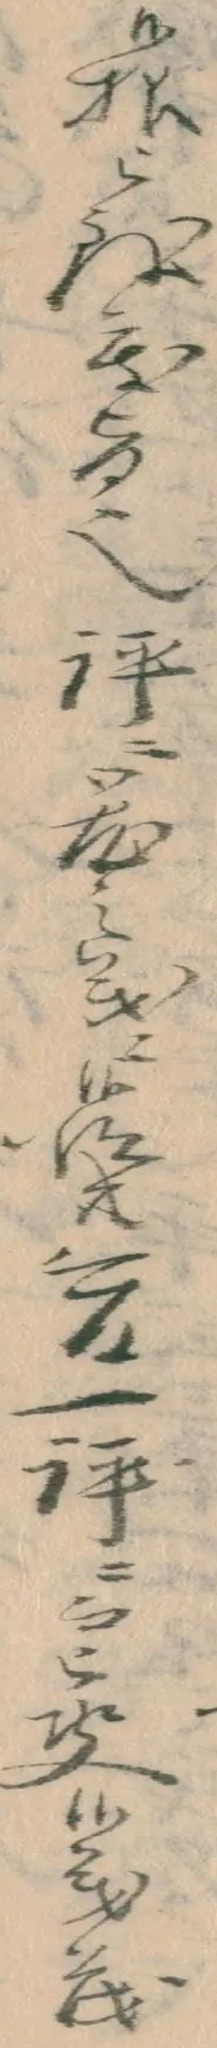候様被致度旨也評ニ御尤之義ニ候得共今日一評ニ而被決候義も
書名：賀茂社記録. 第65冊
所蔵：国立国会図書館 National Diet Library, JAPAN
